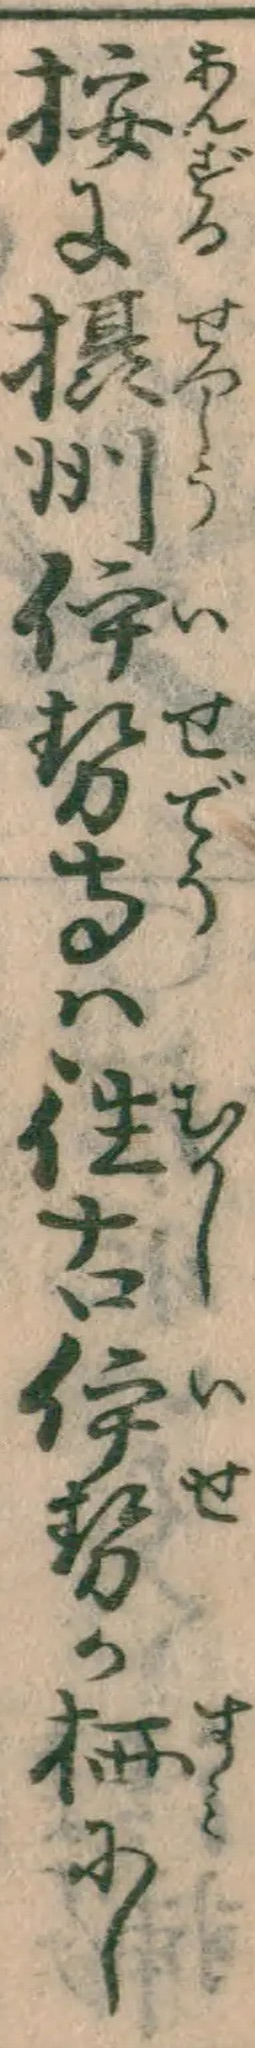按に摂州伊勢寺は往古伊勢か栖にし
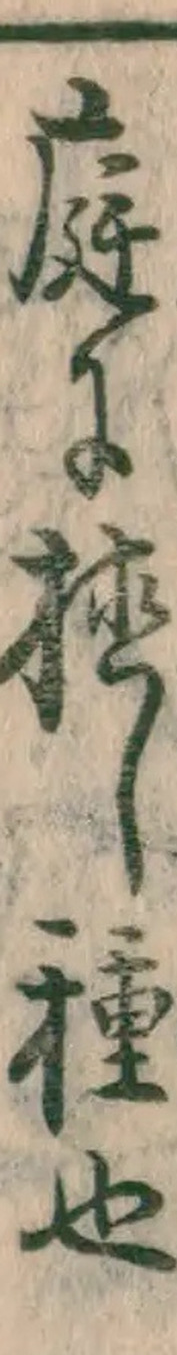庭に植し種也
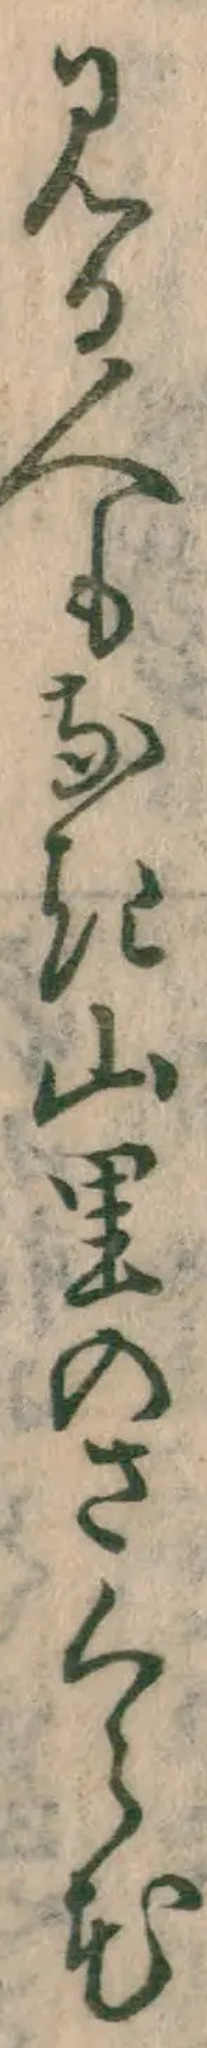見る人もなき山里のさくら花
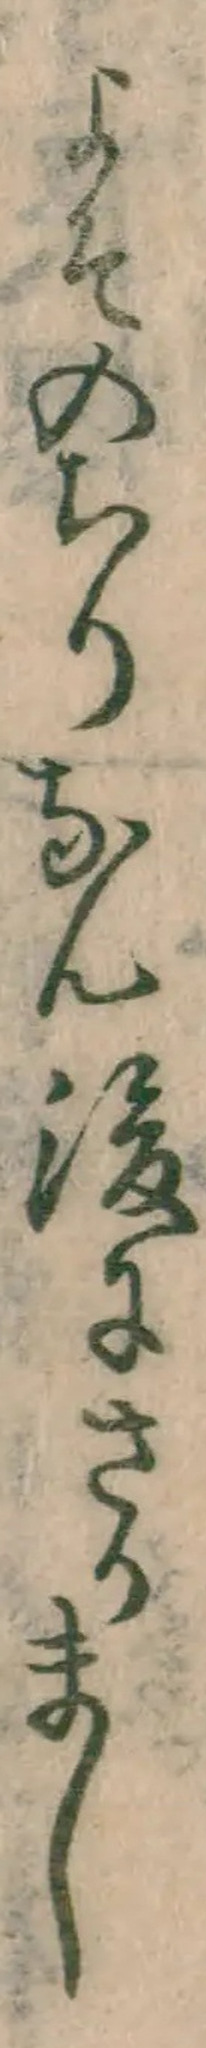よそのちりなん後にさかまし

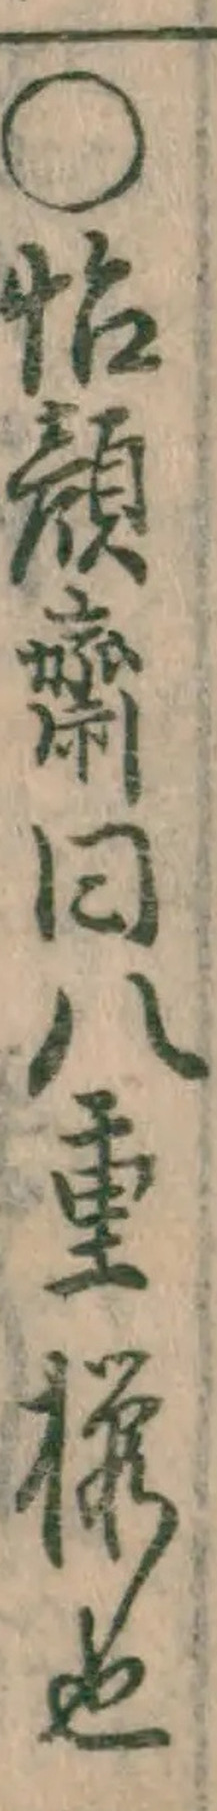○怡顔斎曰八重桜也
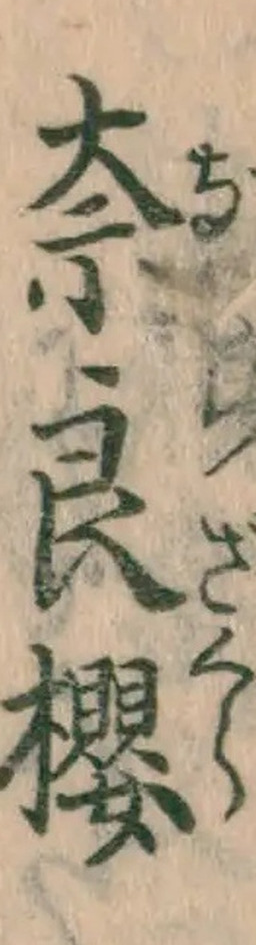奈良桜
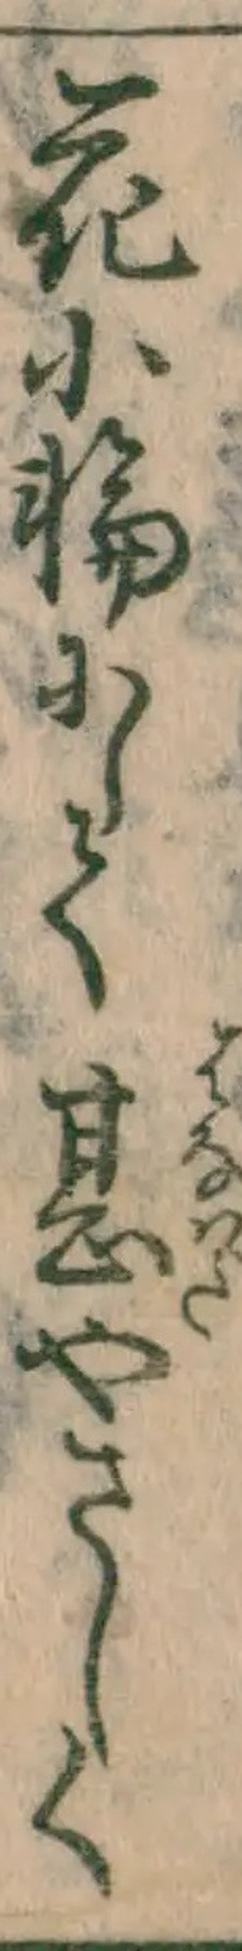花小輪にして甚やさしく
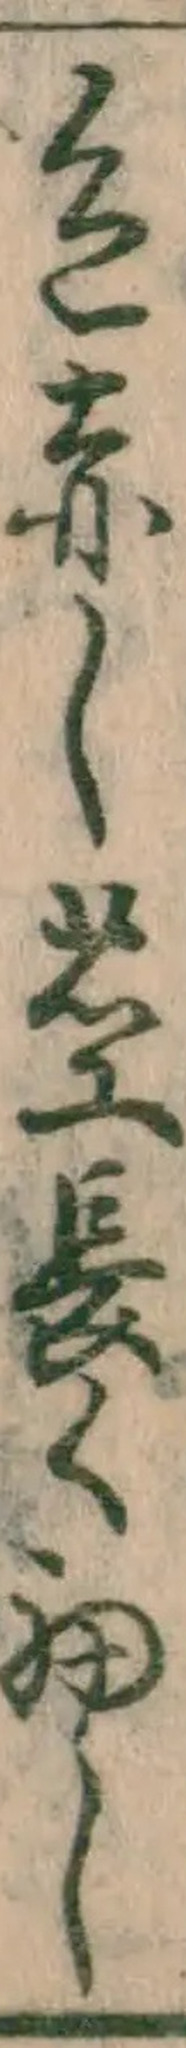色赤し茎長く細し
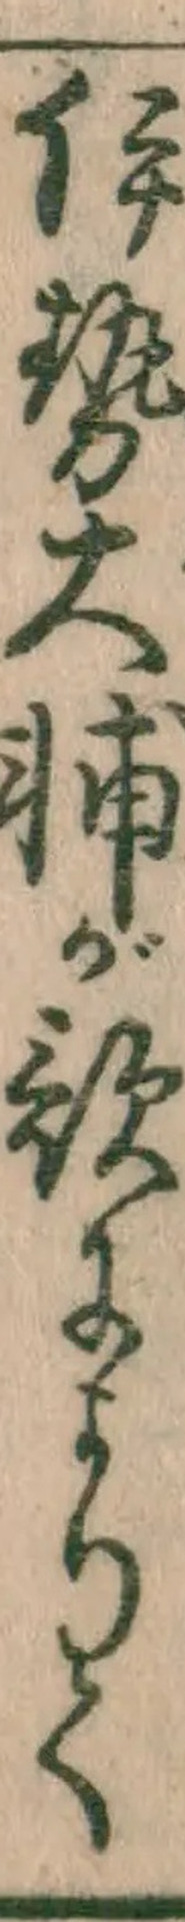伊勢大輔が歌によりて
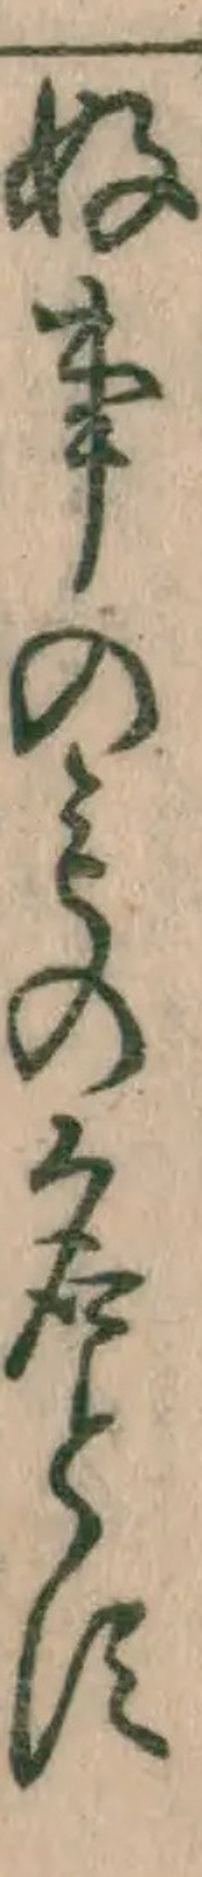好事のもの名とす
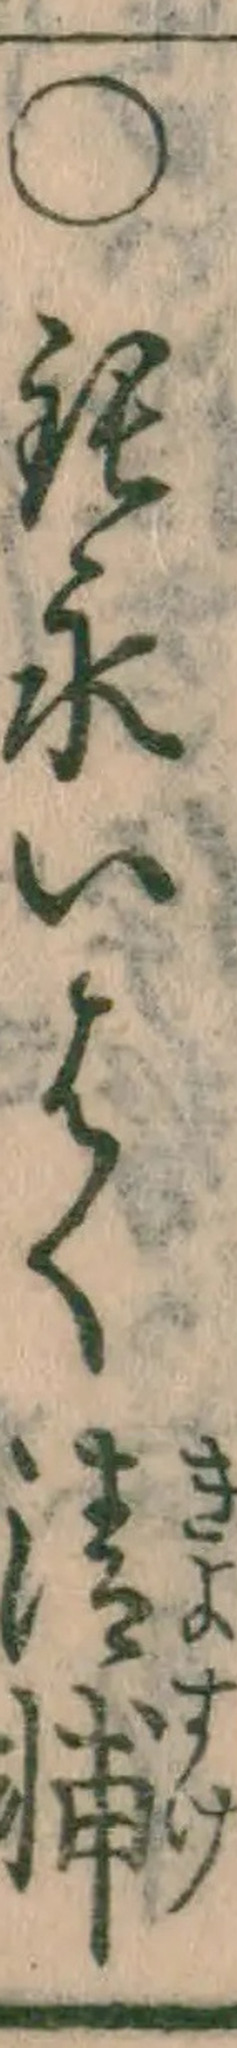○鈍永いはく清輔
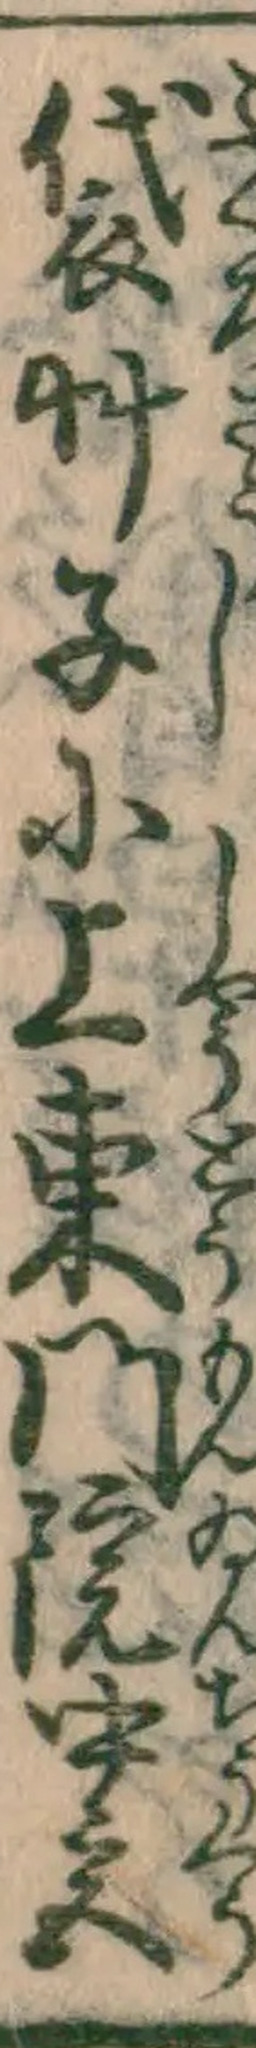袋草紙に上東門院中宮
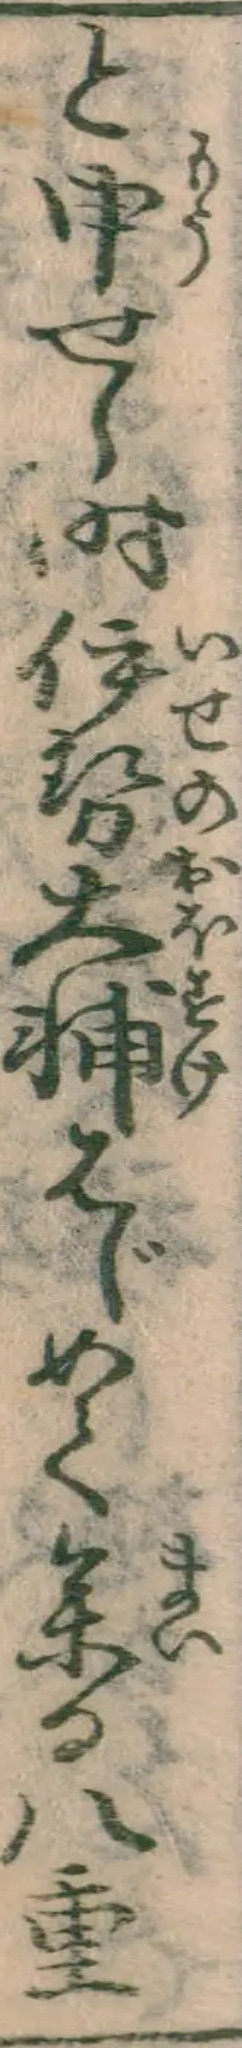と申せし時伊勢大輔はじめて参る八重
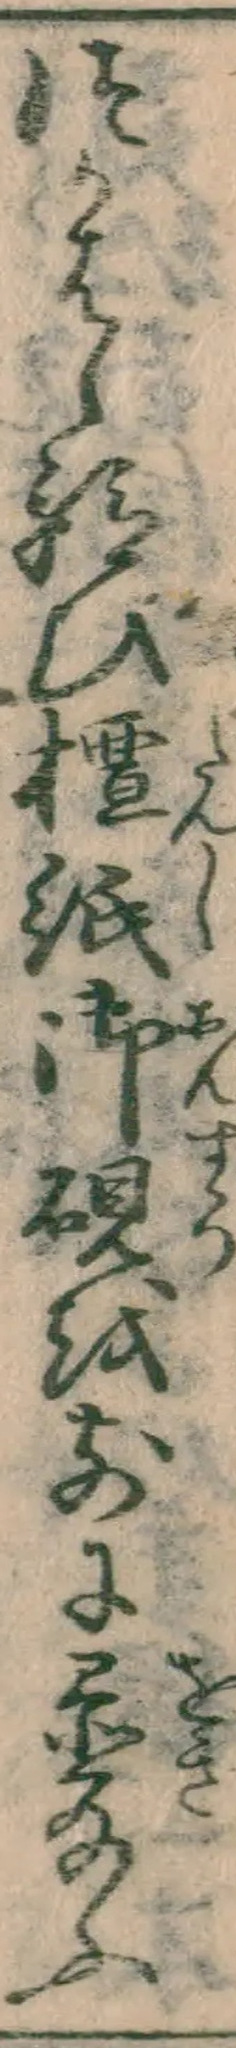つかはし給ひ檀紙御硯を前に置給ふ
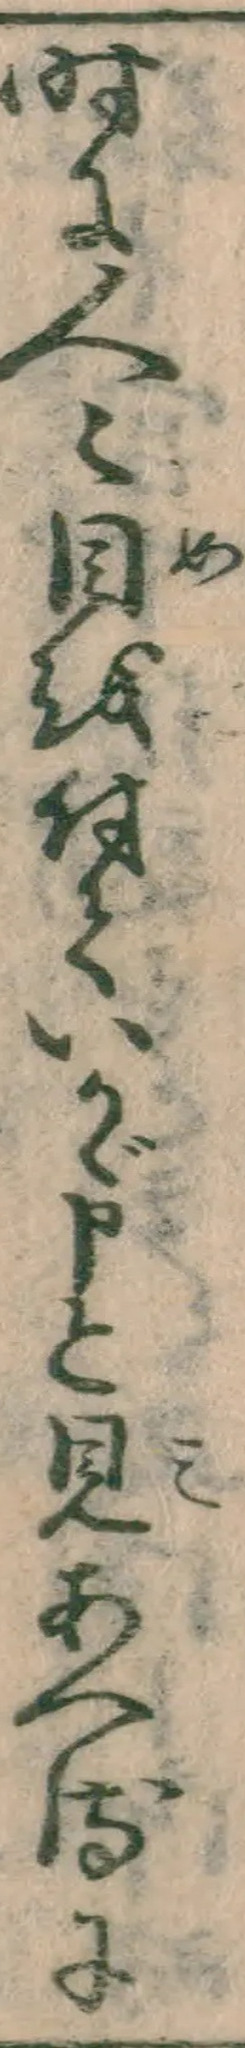時に人々目を付ていかゞ申と見あへるに
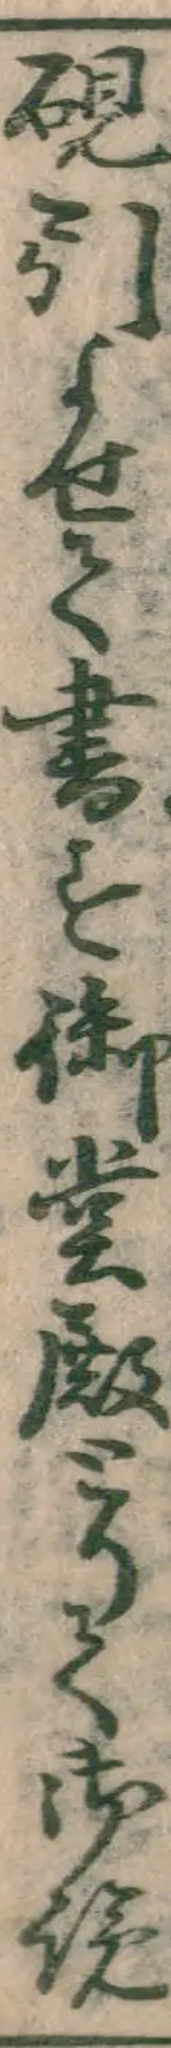硯引よせて書す御堂殿とりて御覧
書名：怡顔齋櫻品
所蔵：国立国会図書館 National Diet Library, JAPAN
